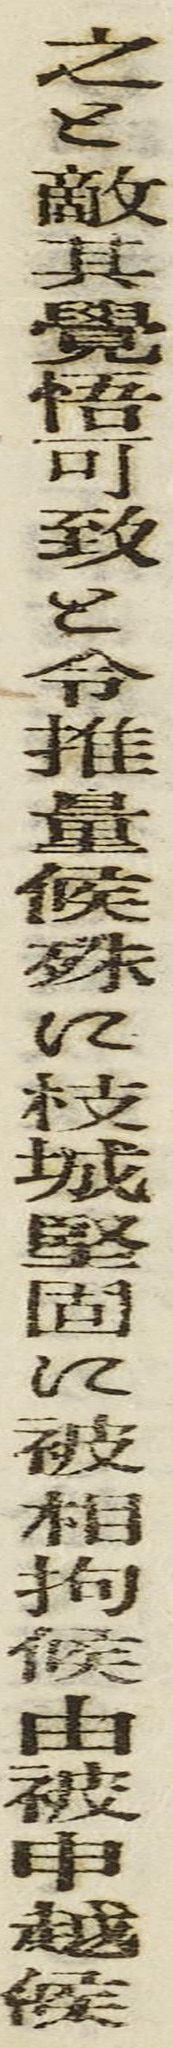之と敵其覚悟可致と令推量候殊に枝城堅固に被相拘候由被申越候
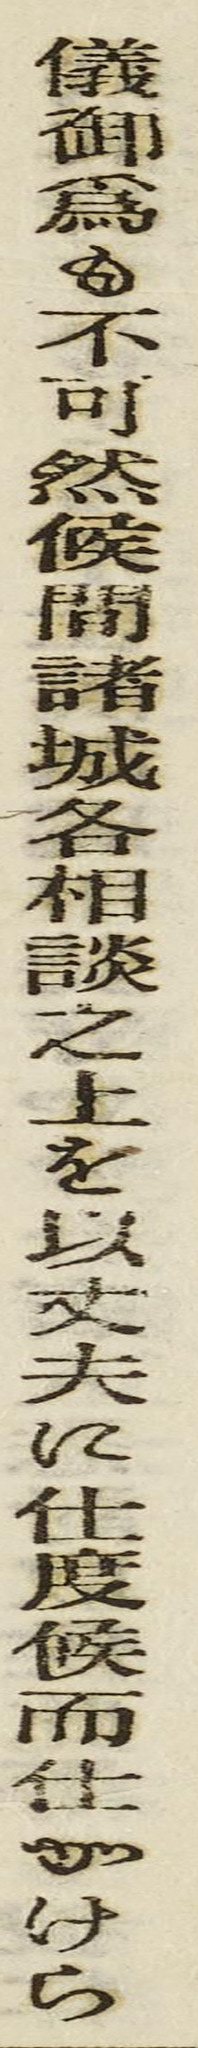儀御為も不可然候間諸城各相談之上を以丈夫に仕度候而仕かけら
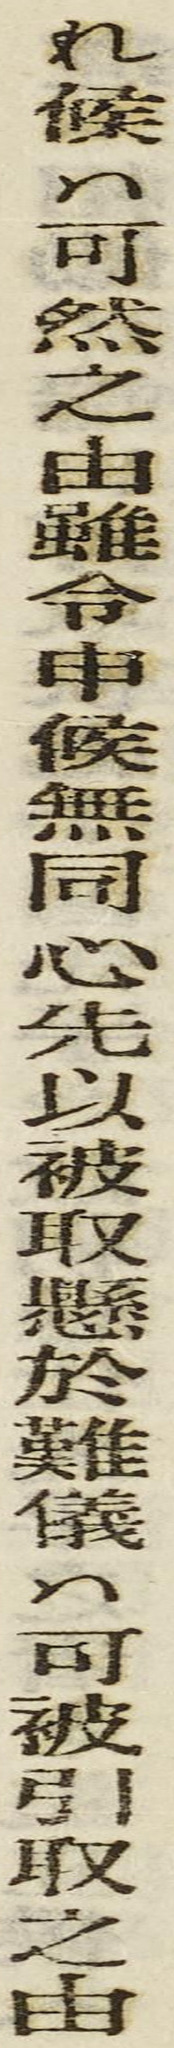れ候ハ可然之由雖令申候無同心先以被取懸於難儀ハ可被引取之由
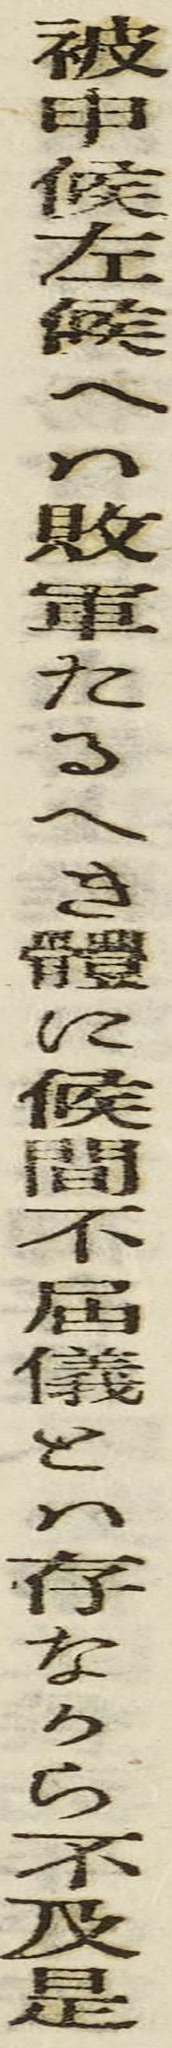被申候左候へハ敗軍たるへき体に候間不届儀とハ存なから不及是
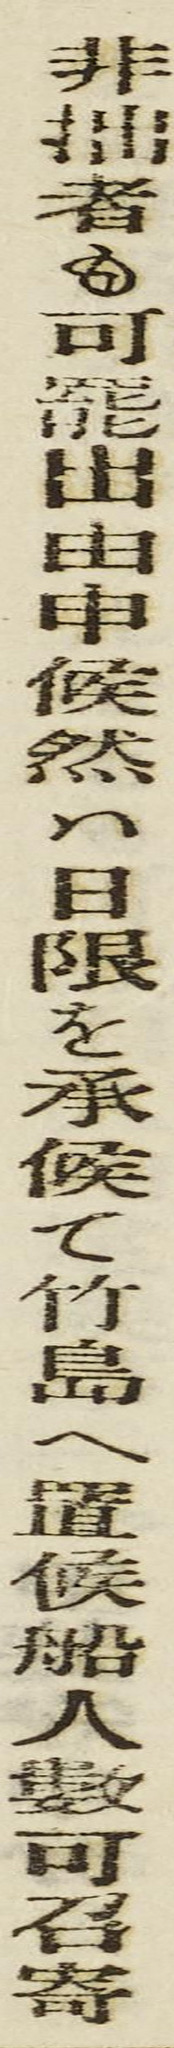非拙者も可罷出由申候然ハ日限を承候て竹島へ置候船人数可召寄
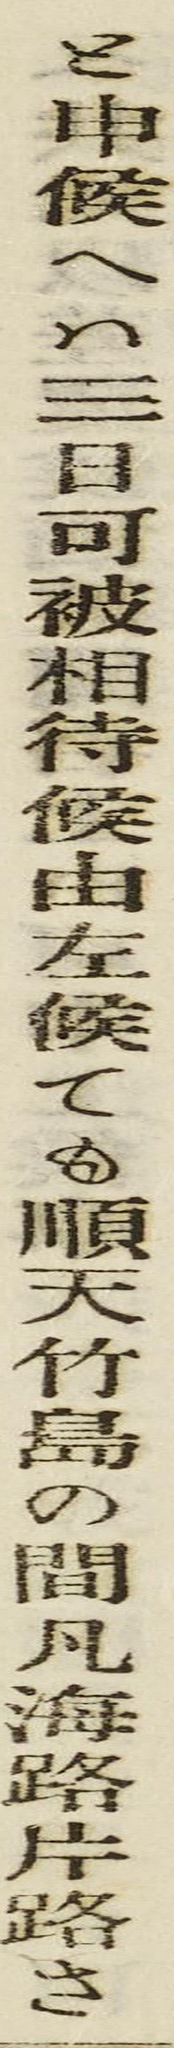と申候へハ三日可被相待候由左候ても順天竹島の間凡海路岸路さ
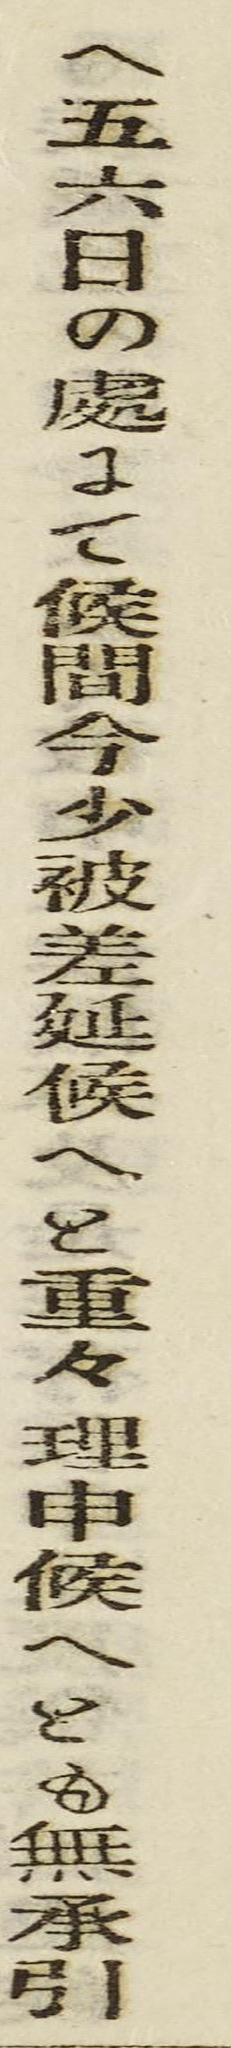へ五六日の処にて候間今少被差延候へと重々理申候へとも無承引
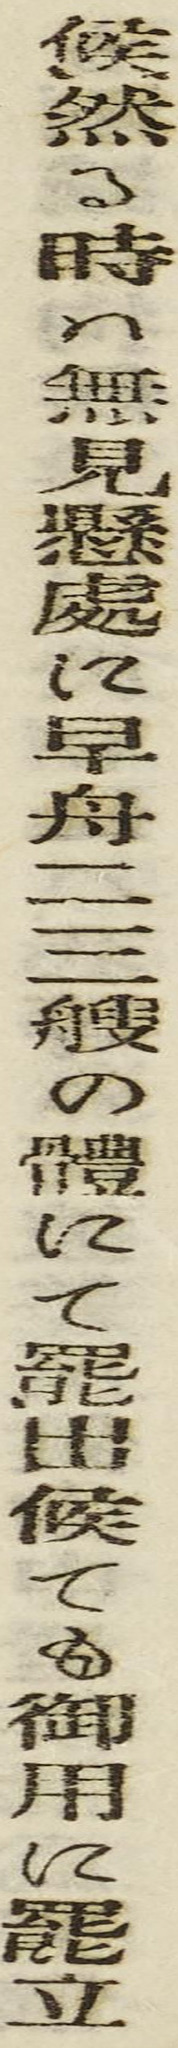候然る時ハ無見懸処に早舟二三艘の体にて罷出候ても御用に罷立
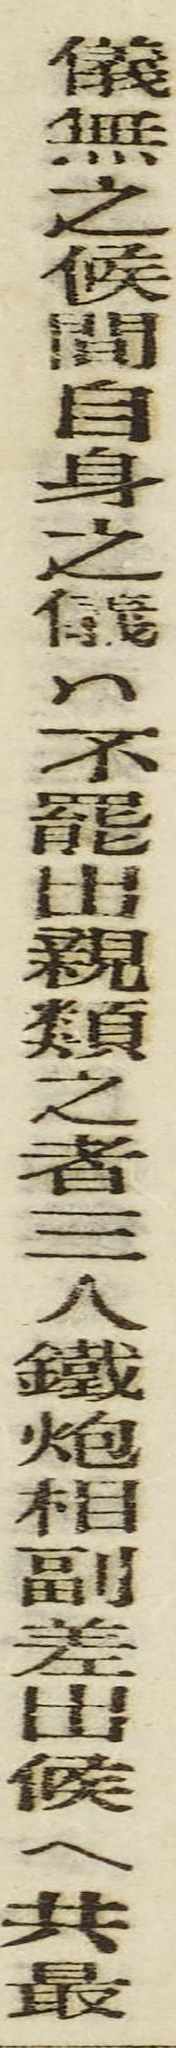儀無之候間自身之儀ハ不罷出親類之者三人鉄砲相副差出候へ共最

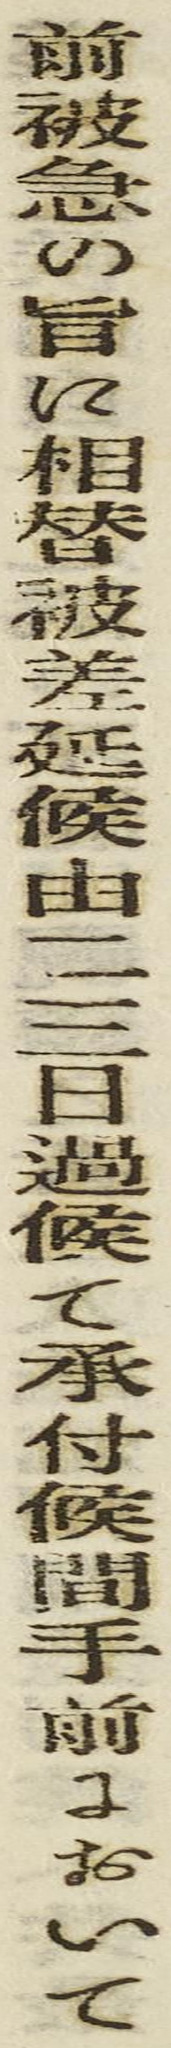前被急の旨に相替被差延候由二三日過候て承付候間手前において
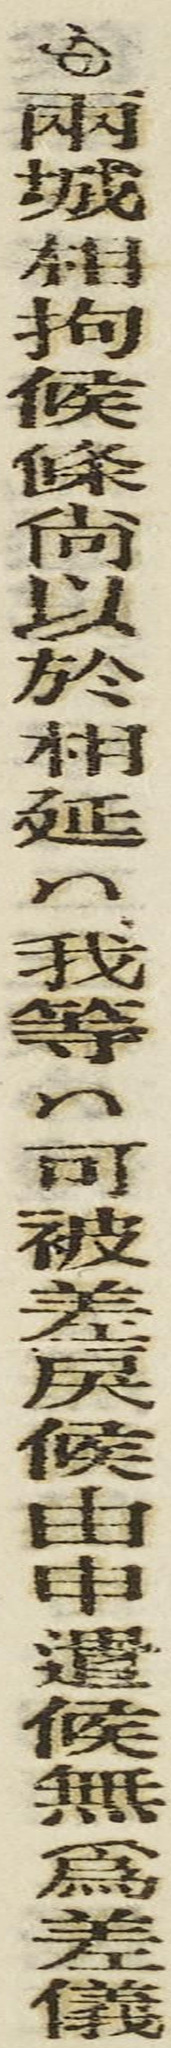も両城相拘候条尚以於相延ハ我等ハ可被差戻候由申遣候無為差儀
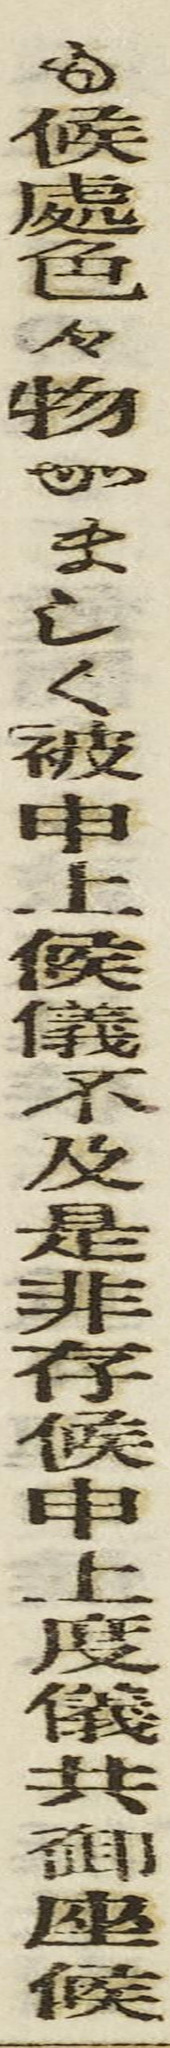も候処色々物かましく被申上候儀不及是非存候申上度儀共御座候
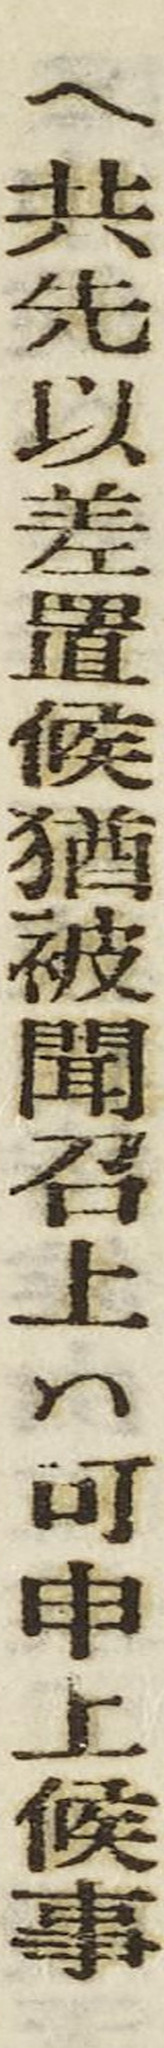へ共先以差置候猶被聞召上ハ可申上候事
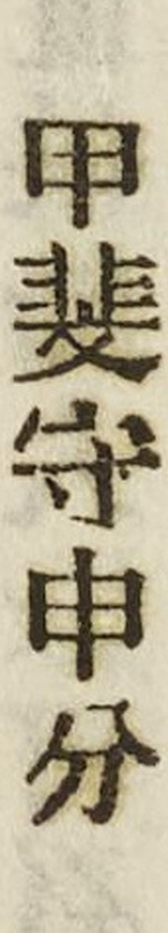甲斐守申分
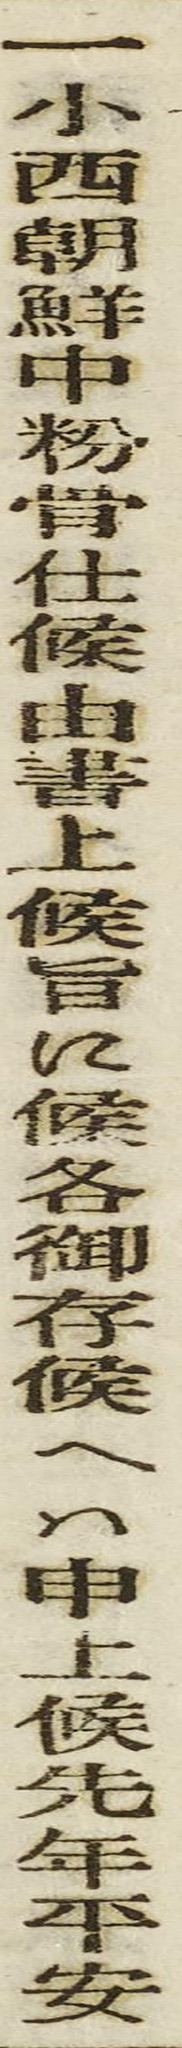一小西朝鮮中粉骨仕候由書上候旨に候各御存候へハ申上候先年平安
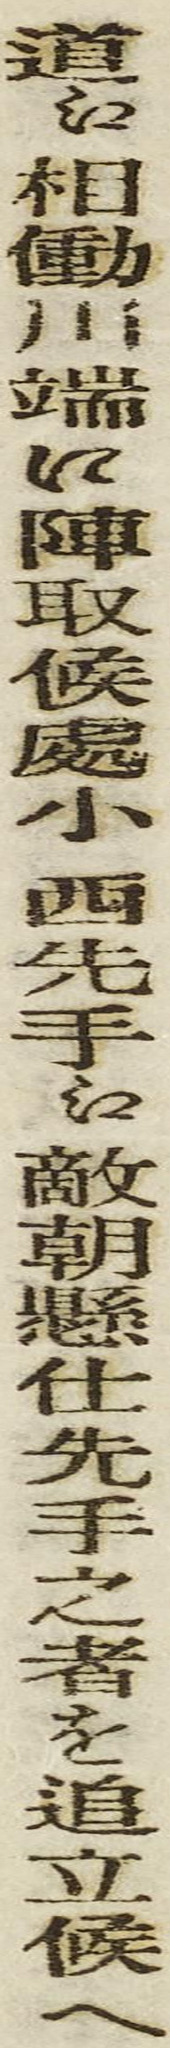道え相働川端に陣取候処小西先手え敵朝懸仕先手之者を追立候へ
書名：史籍集覽　朝鮮陣古文・細井廣澤記・颶風紀事・天明七年將軍宣下次第書　全
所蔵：東京大学地震研究所図書室 Earthquake Research Institute Library, The University of Tokyo, JAPAN
